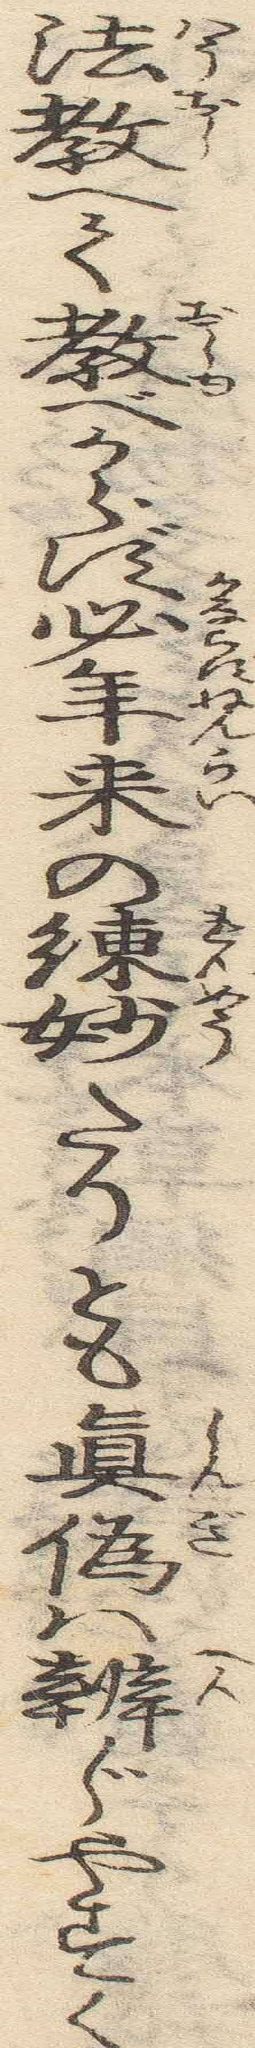法教へて教べからず必年来の練妙たりとも真偽は弁じやすく
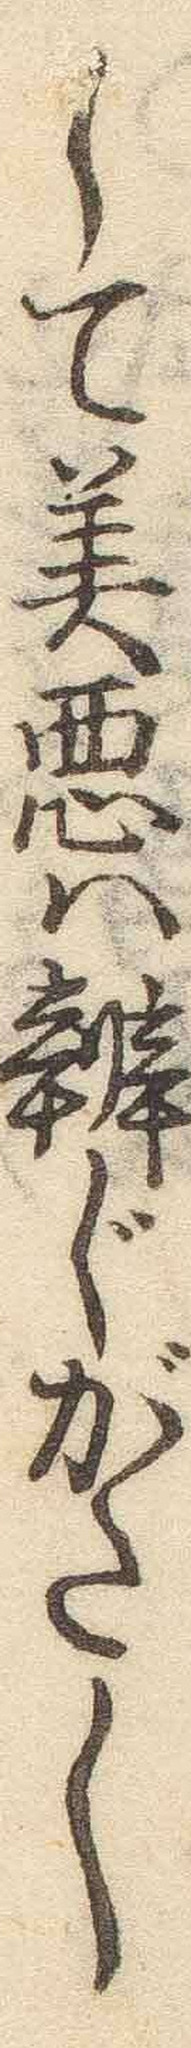して美悪は弁じがたし
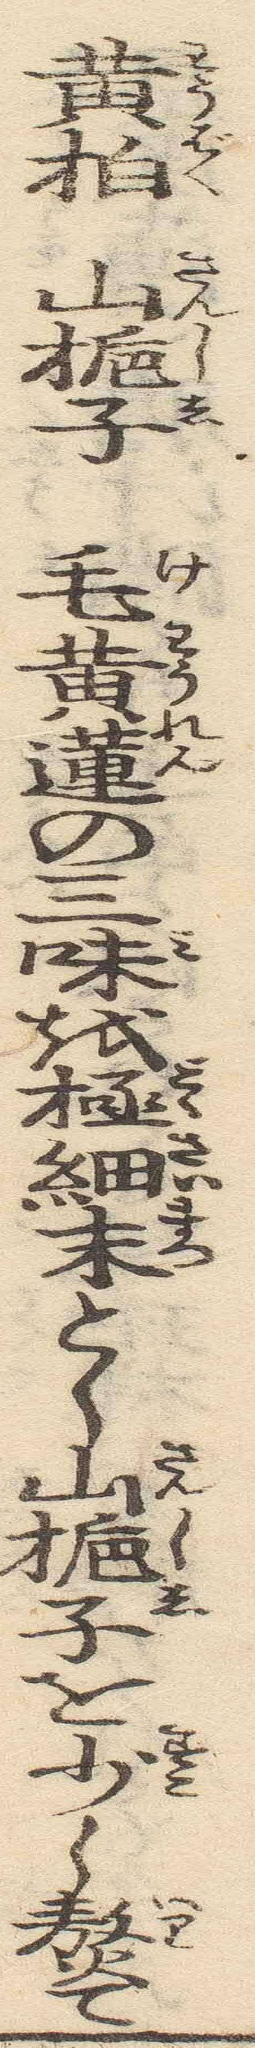黄柏山梔子毛黄蓮の三味を極細末とし山梔子を少し熬て
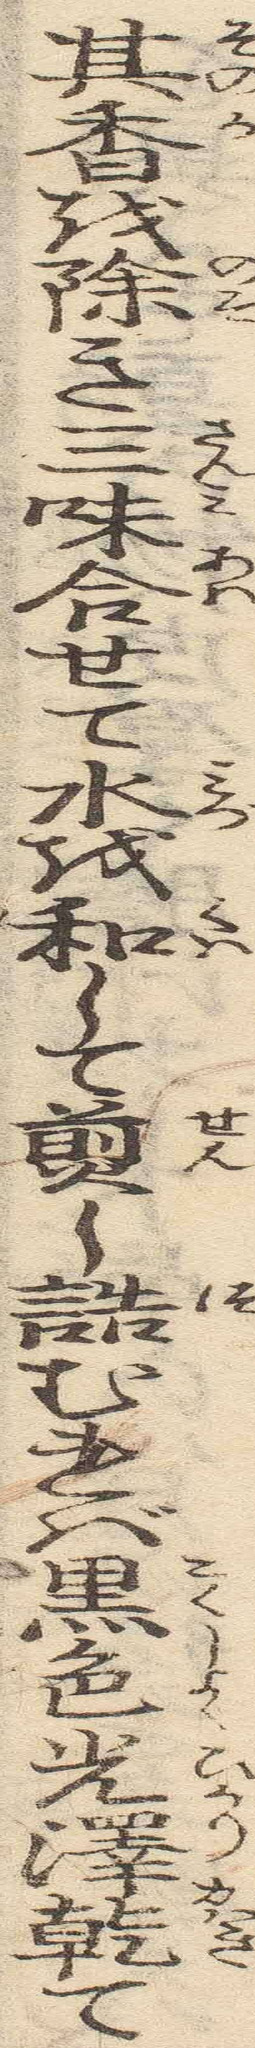其香を除き三味合せて水を和して煎し誥むれば黒色光澤乾て
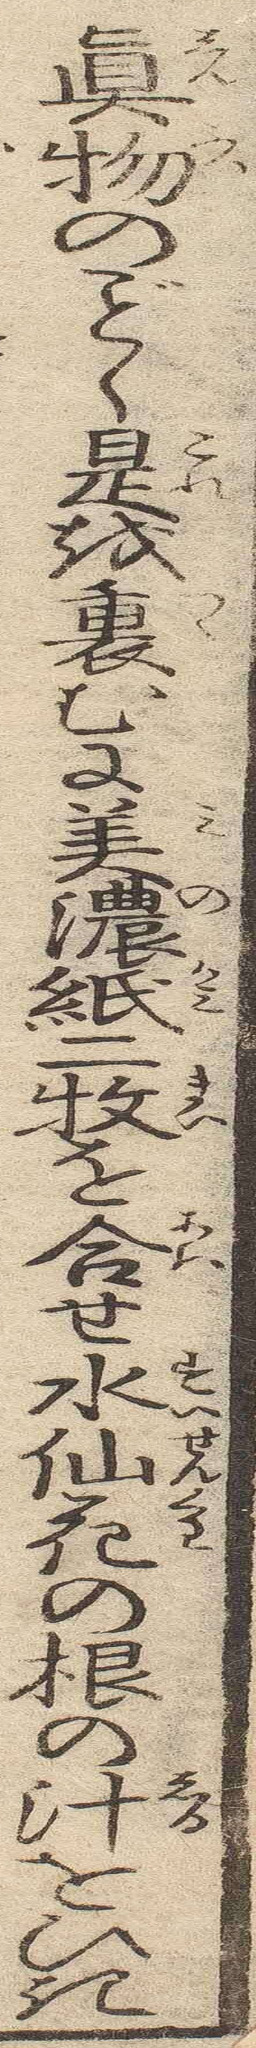真物のごとし是を裹むに美濃紙二枚を合せ水仙花の根の汁をひき
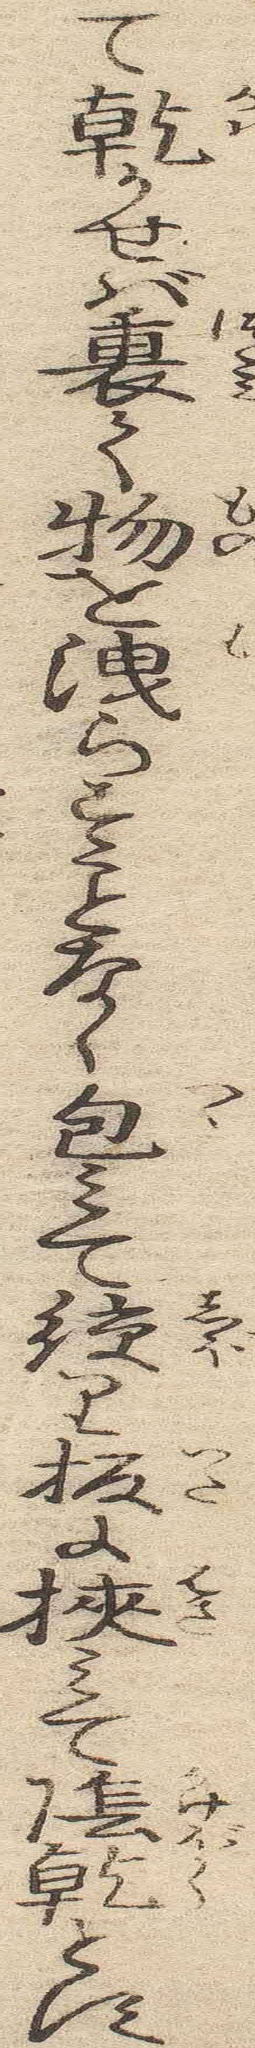て乾かせば裹て物を洩らすことなし包みて絞り板に挟みて陰乾とす
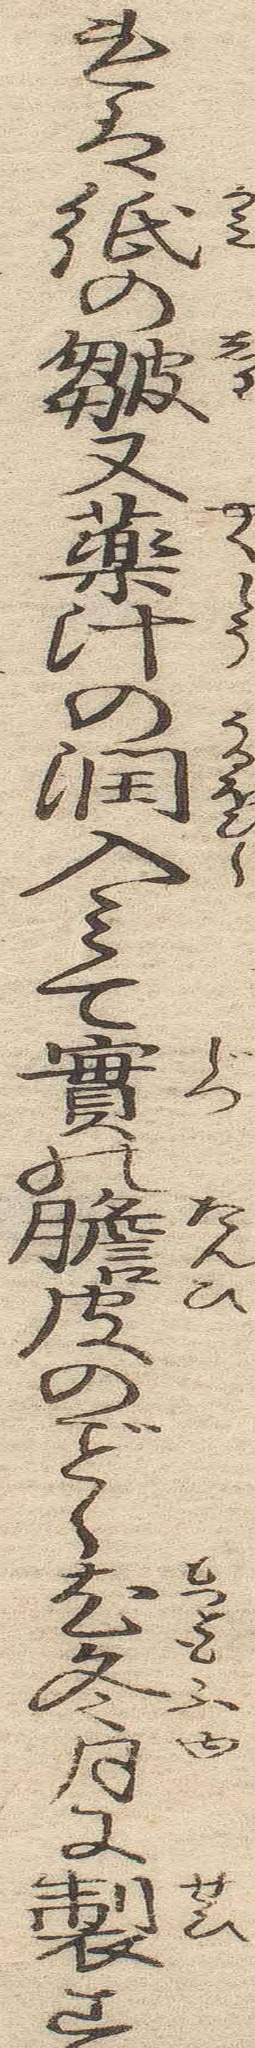れは紙の皺又薬汁の潤入みて実の膽皮のごとし尤冬月に製す
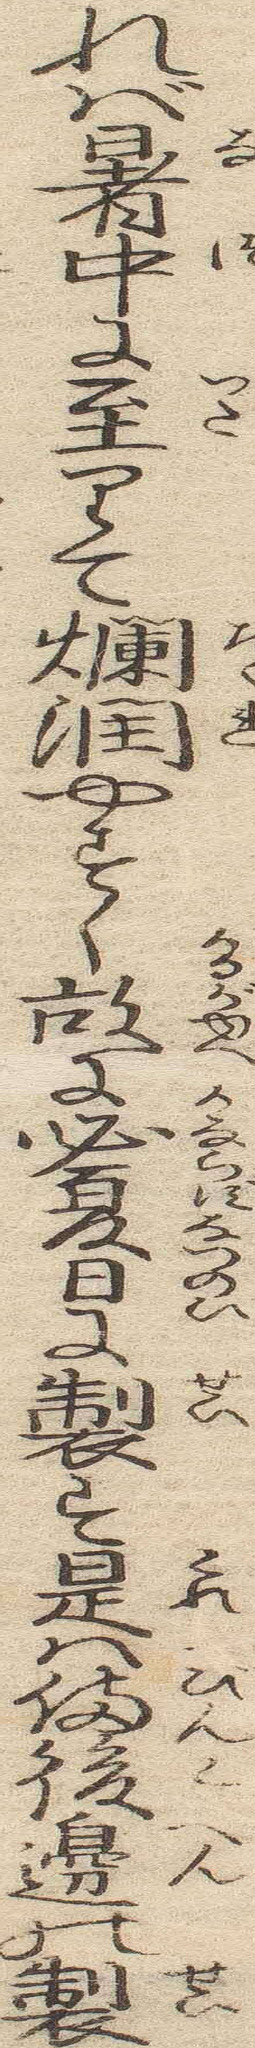れば暑中に至りて爛潤やすし故に必夏日に製す是は備後辺の製
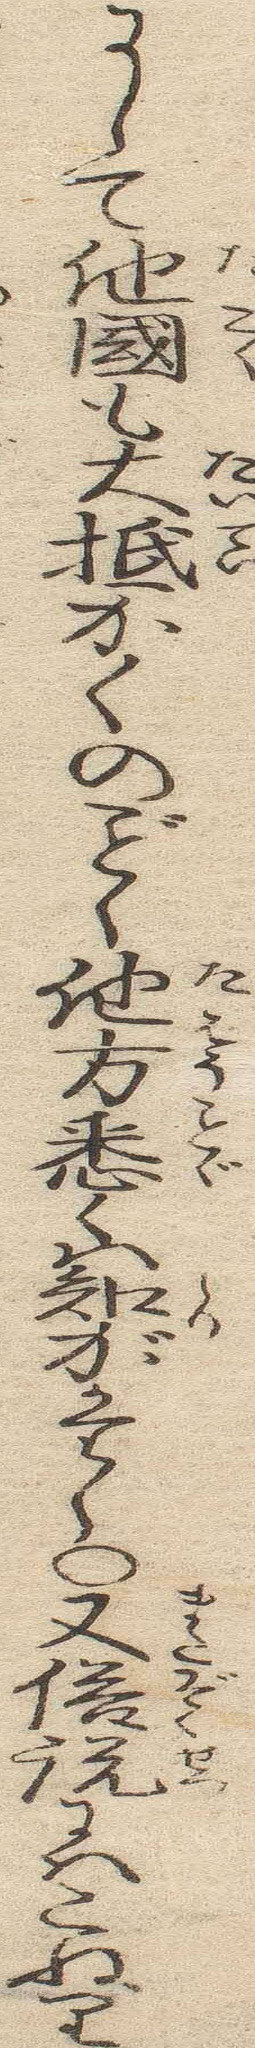にして他国も大抵かくのごとし他方悉くは知がたし○又俗説にはこねり
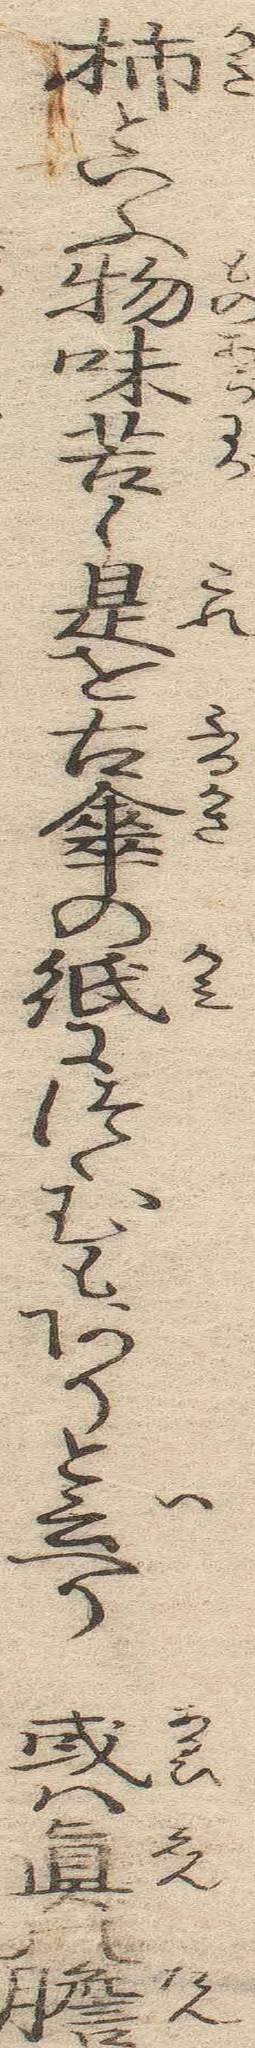柿といふ物味苦し是を古傘の紙につゝむもありと云へり或は真の膽
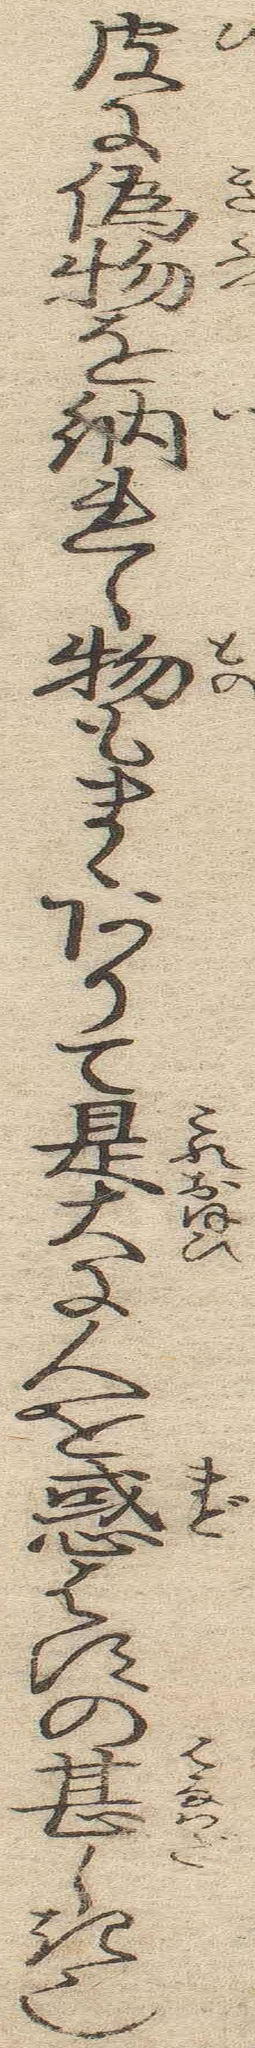皮に偽物を納れし物もまゝありて是大に人を惑はすの甚しき也
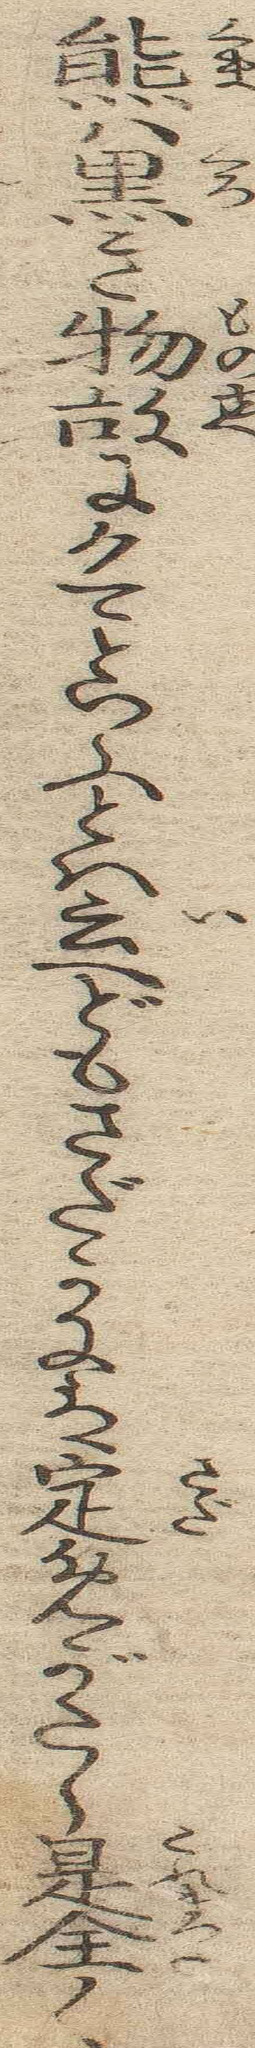熊は黒き物故にクマといふとは云へどもさだかには定めがたし是全く
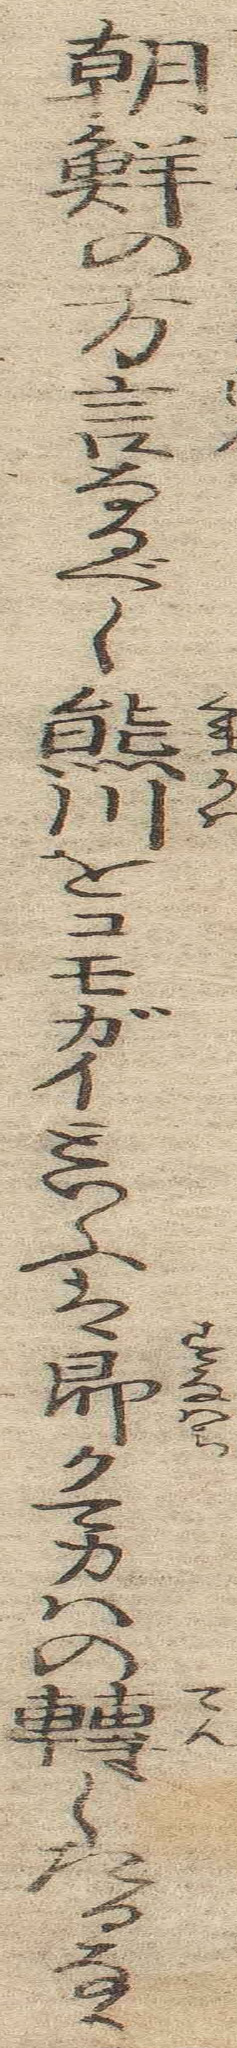朝鮮の方言なるべし熊川をコモガイといふは即クマカハの転したるなり
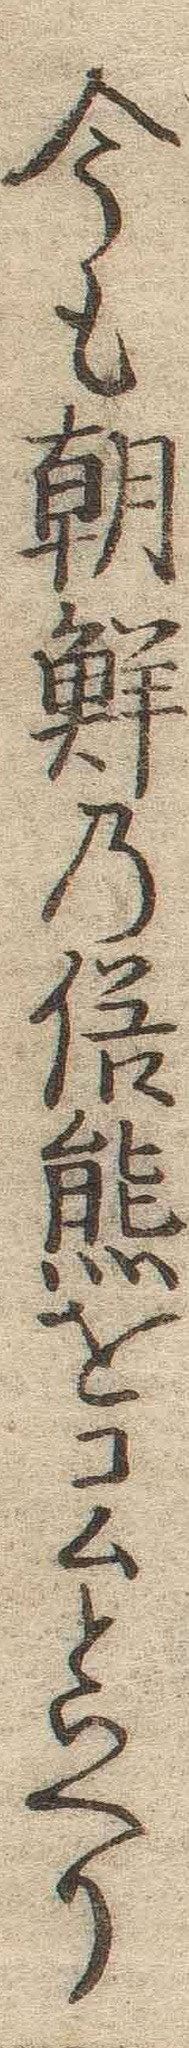今も朝鮮の俗熊をコムといへり川音

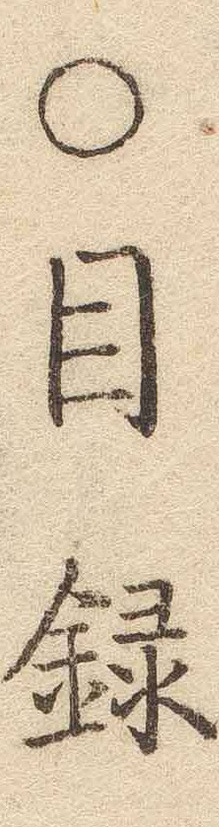◯目録

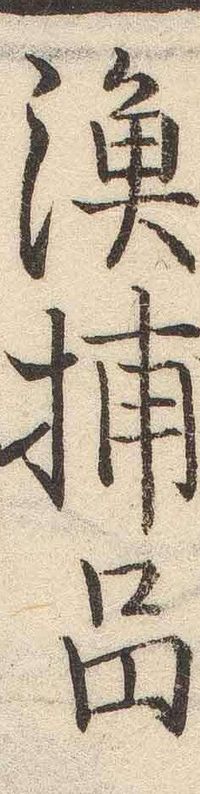漁捕品
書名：日本山海名産図会
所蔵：東京学芸大学附属図書館 国文学研究資料館
